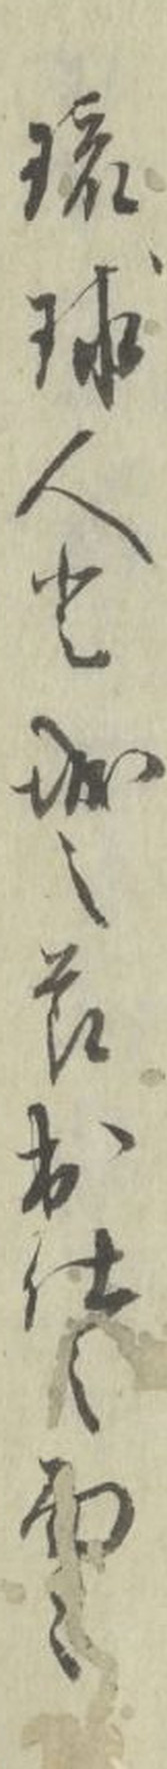琉球人登城之節出仕之面々
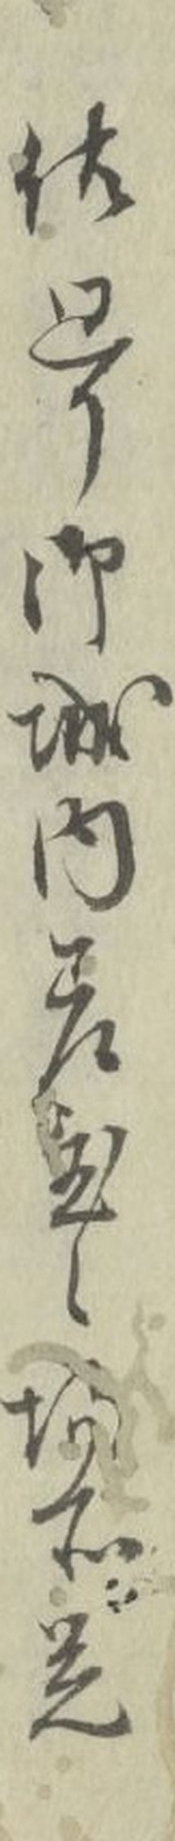供廻り御城内差置候場所覚
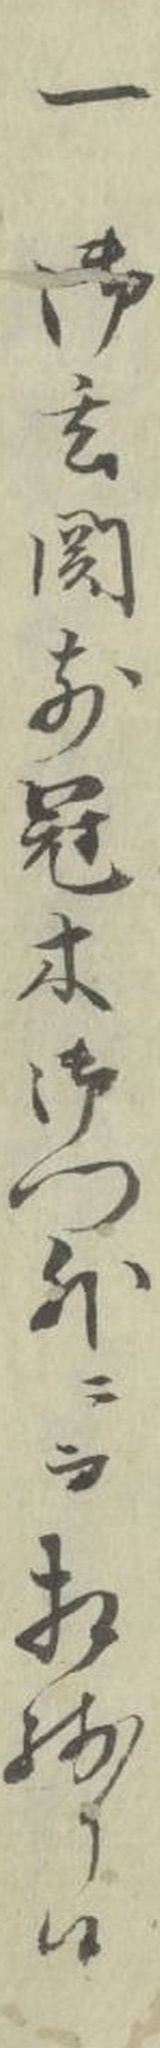一御玄関前冠木御門外に而相残り候

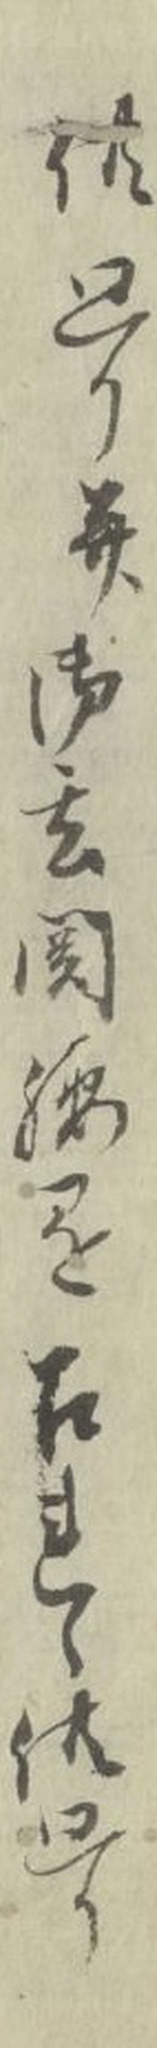供廻り幷御玄関腰懸召連候供廻り
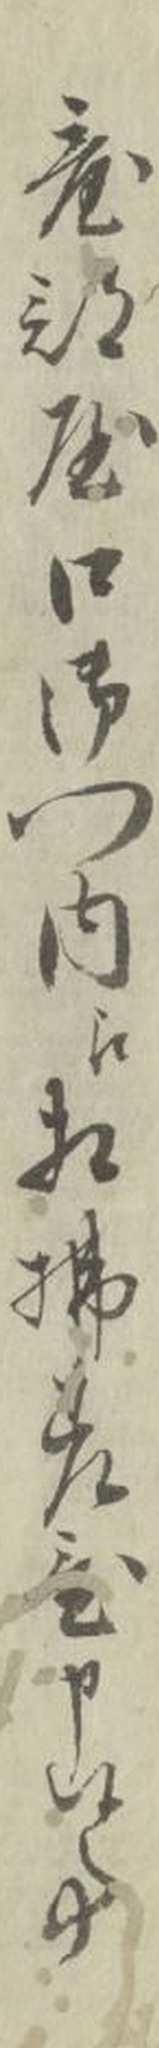台部屋口御門内え相払差置申候事
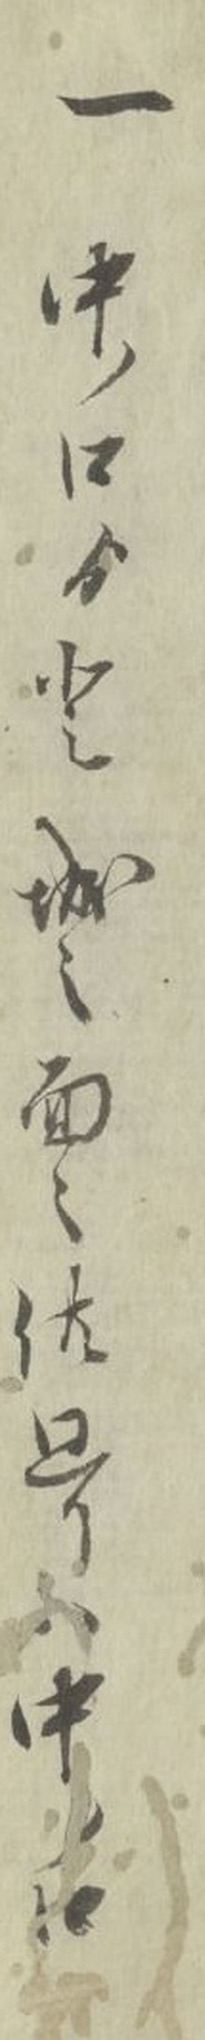一中の口ゟ登城之面々供廻りは中の口
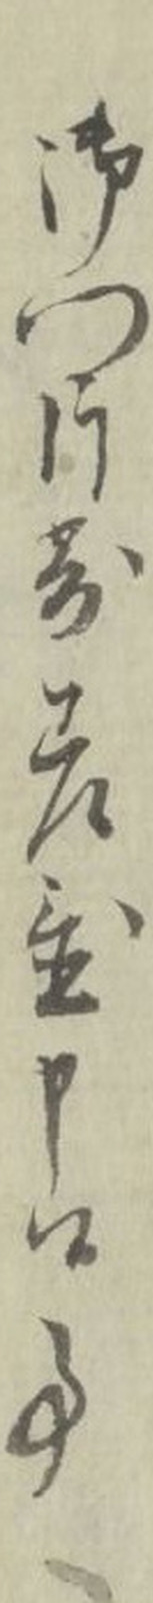御門片寄差置申候事
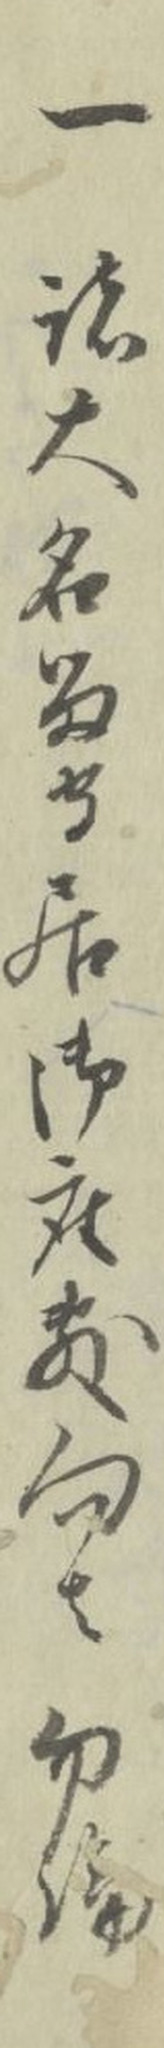一諸大名留守居御座敷向は勿論
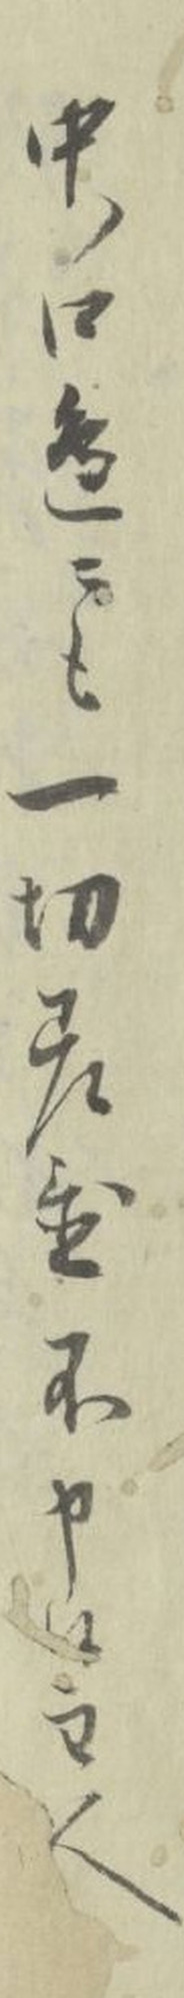中之口辺にも一切差置不申候主人
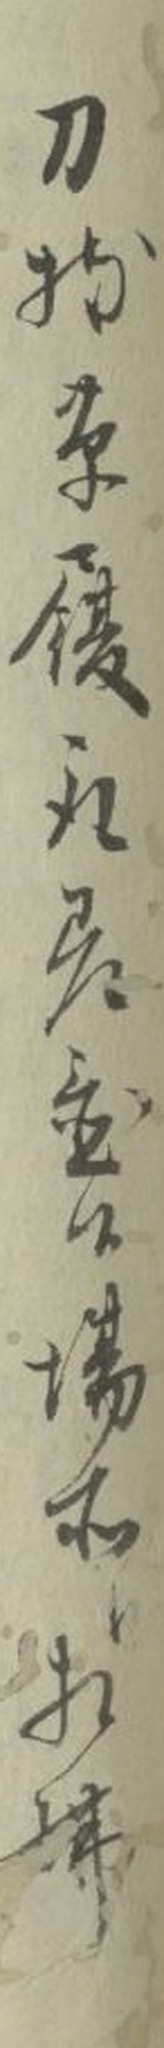刀持草履取差置候場所え相払
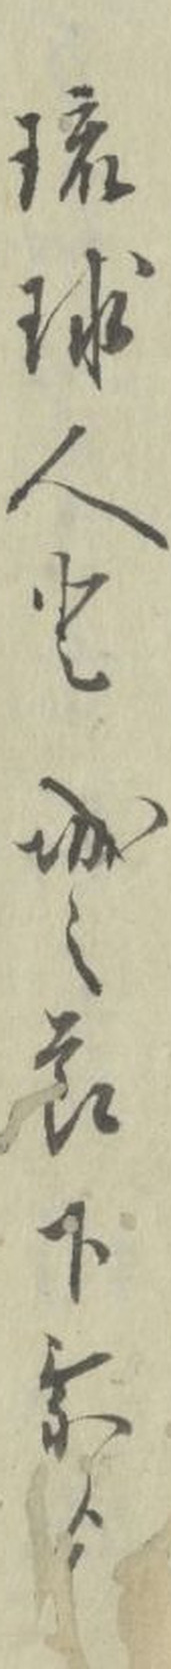琉球人登城之節下乗ゟ
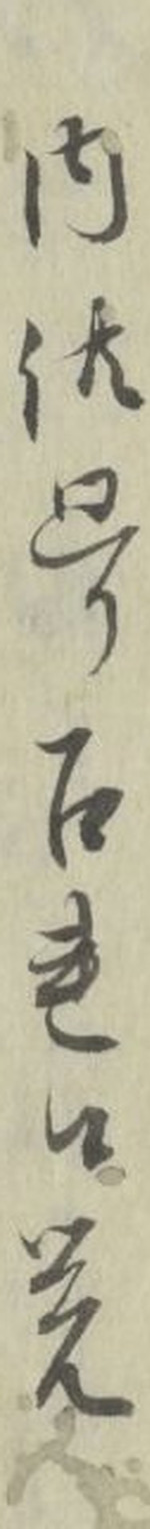内供廻り召連候覚
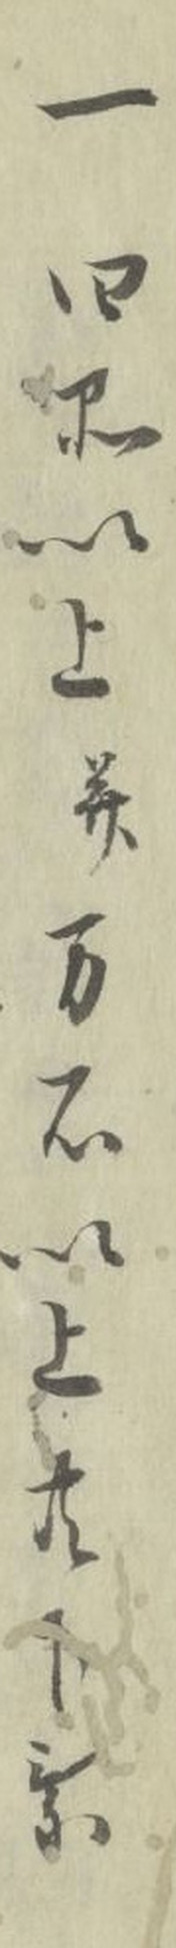一四品以上幷万石以上共下乗
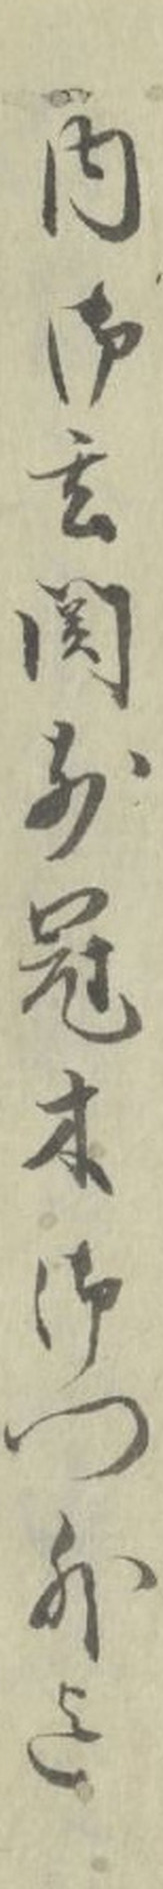内御玄関前冠木御門外迄

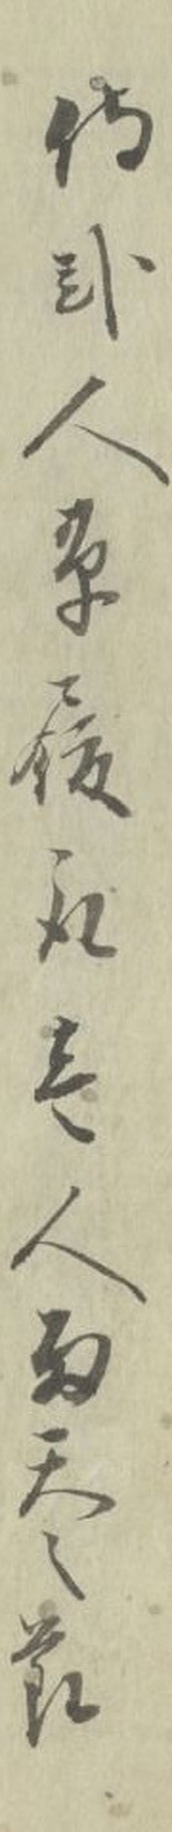侍弐人草履取壱人雨天之節
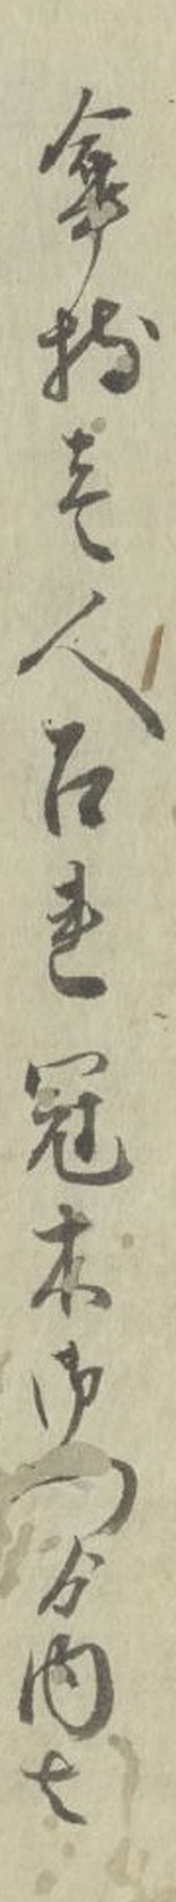傘持壱人召連冠木御門ゟ内は
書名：琉球来朝記 自一至七
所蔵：University of the Ryukyus Library
